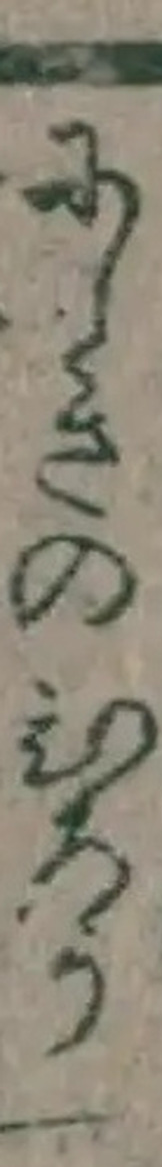にしきのひろう
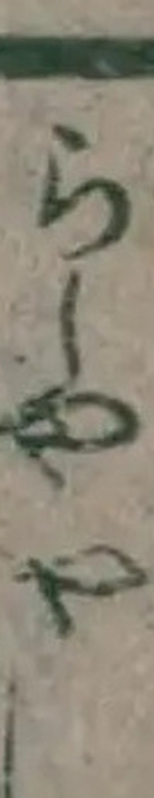らしやや
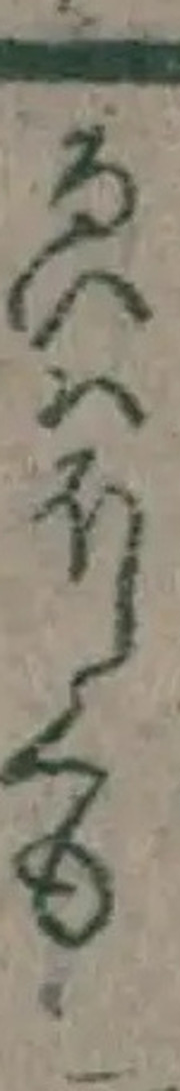るいはほしくも
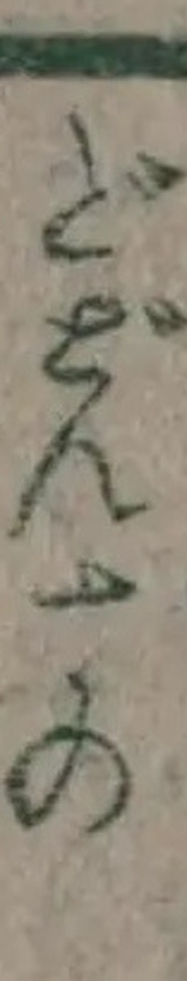どどんすの
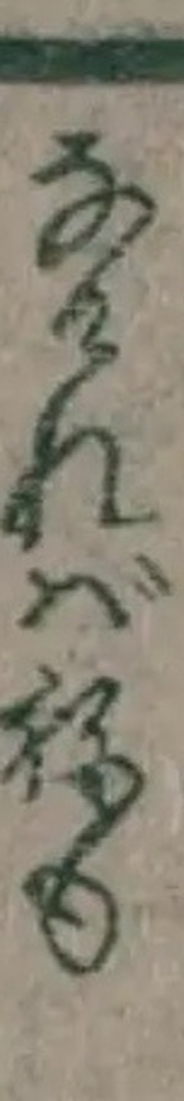なければねも
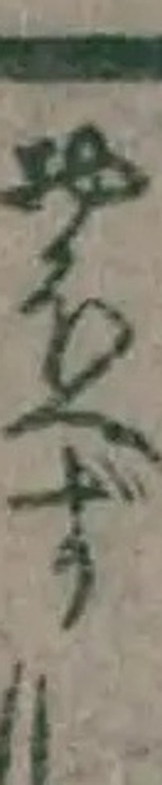おほへず
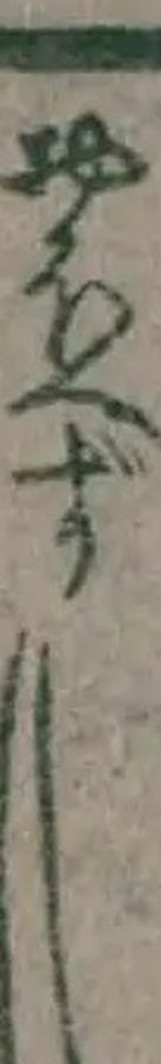おほへず
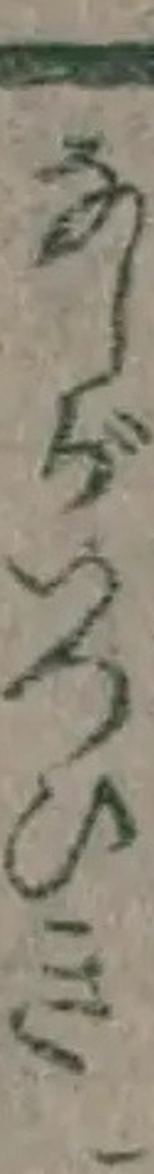なしがいつひき
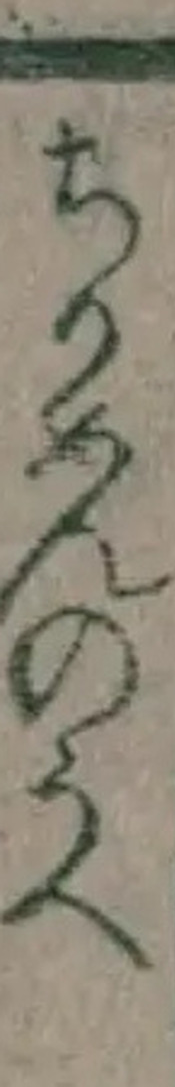ちりめんのうへ
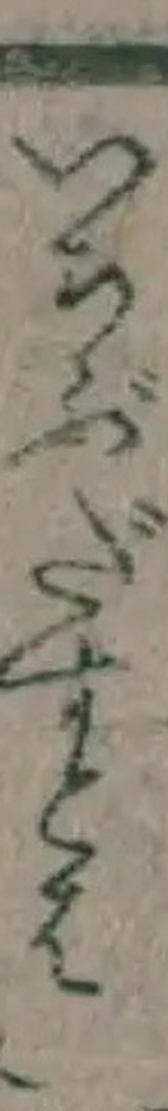いちぶだすとは
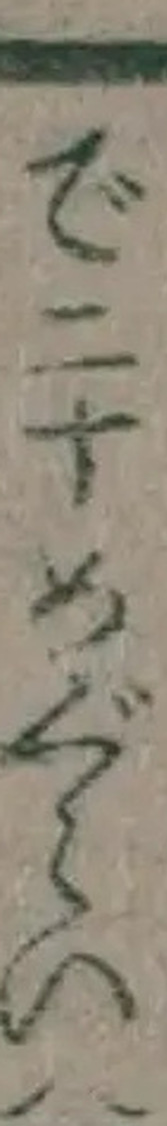で二十めぐらい
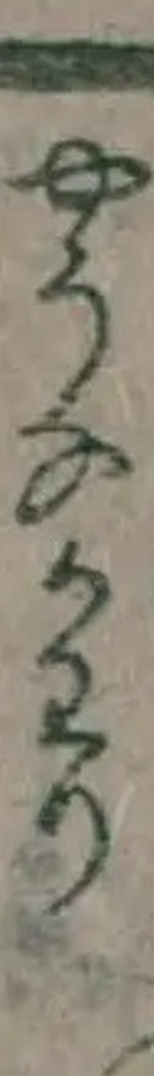やうなかわり
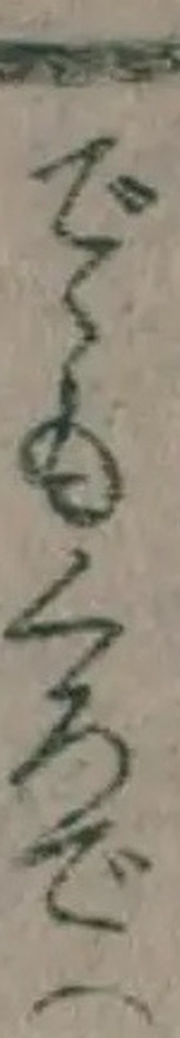でゝもくろで
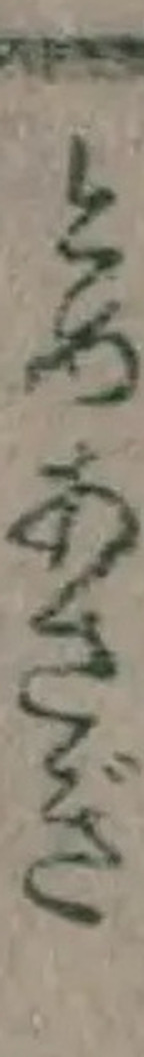とめあさぎ
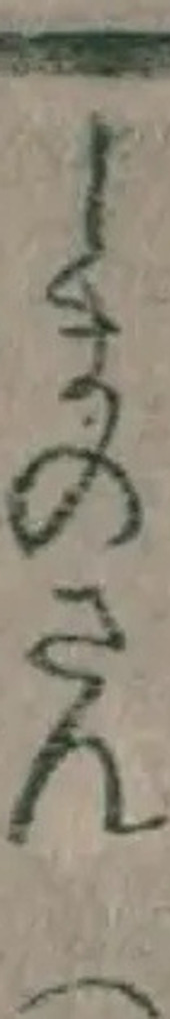しまのさん
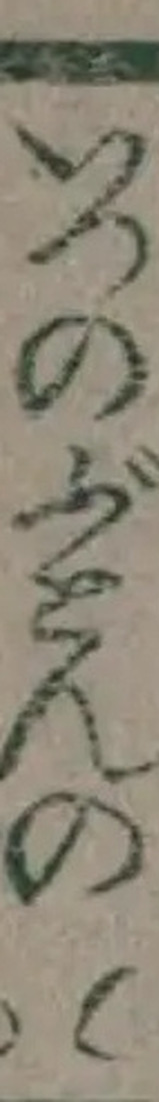いつのぶとんの
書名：縦筒放唐の噺 3巻
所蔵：国立国会図書館 National Diet Library, JAPAN
